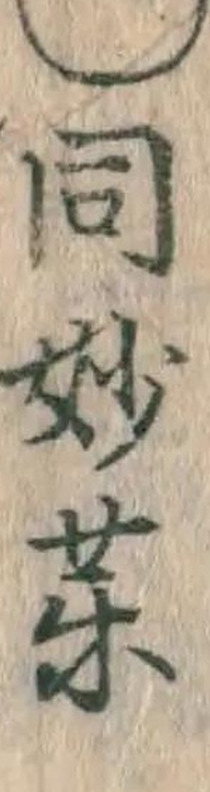○同妙薬
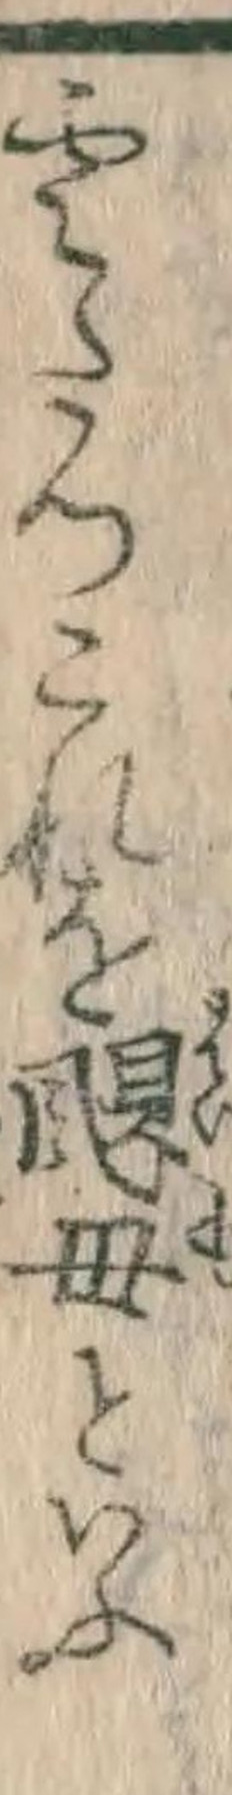雲たつこれを颶母といふ
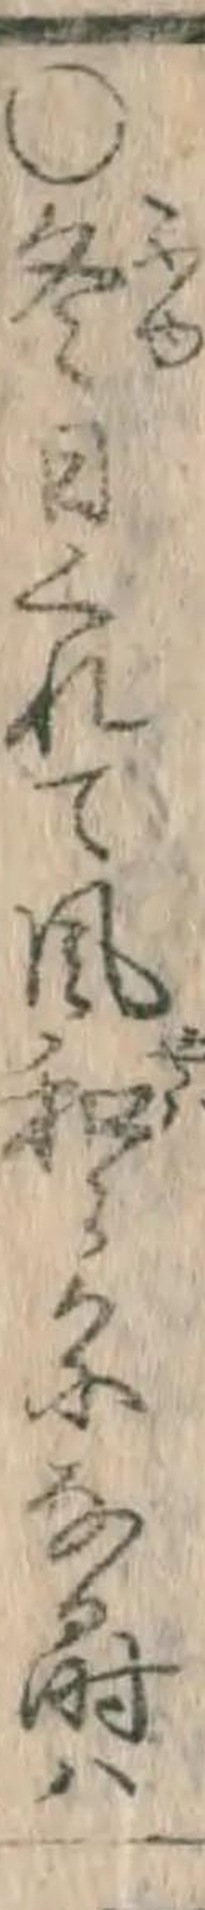○冬日くれて風和らかになる時は
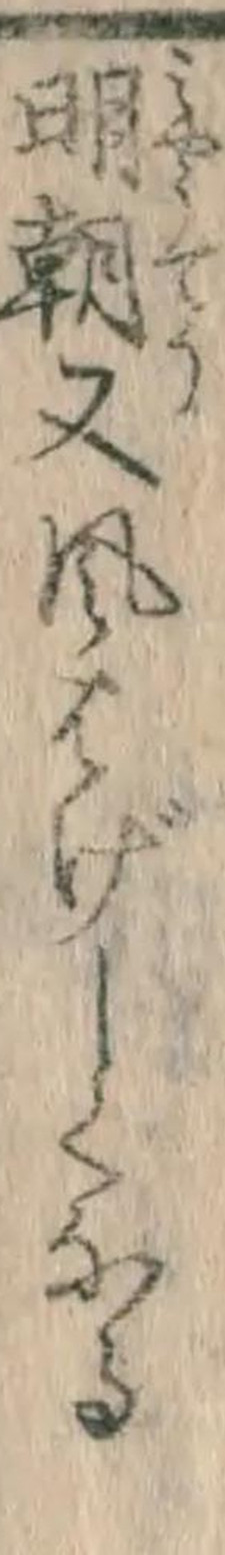明朝又風はげしくなる
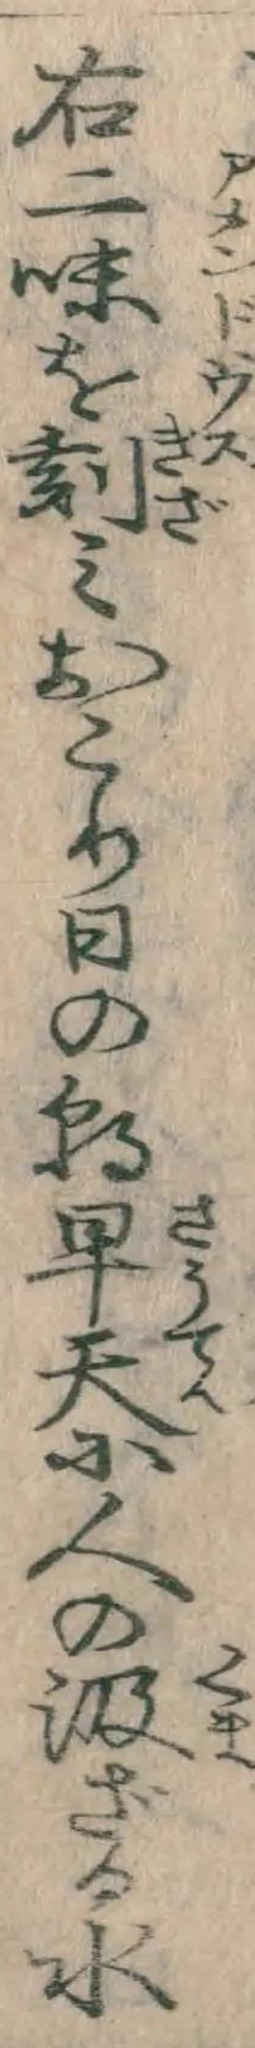右二味を刻みおこり日の朝早天に人の汲ざる水

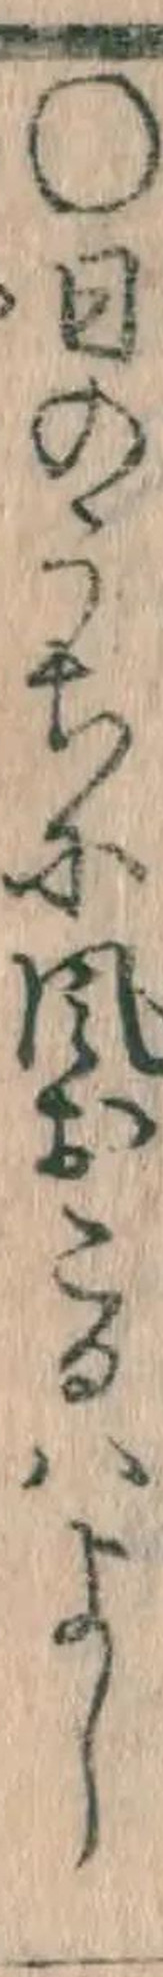○日のうちに風おこるはよし
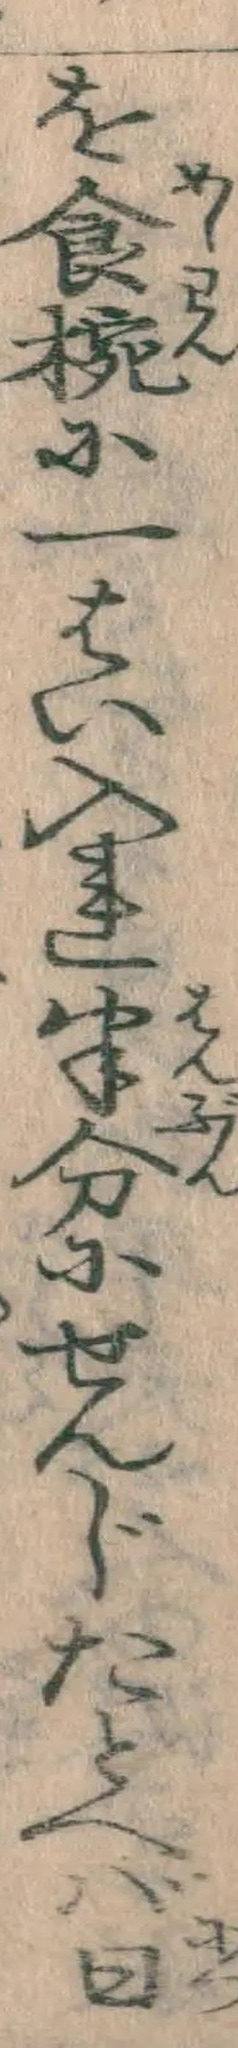を食椀に一はい入れ半分にせんじたとへば日
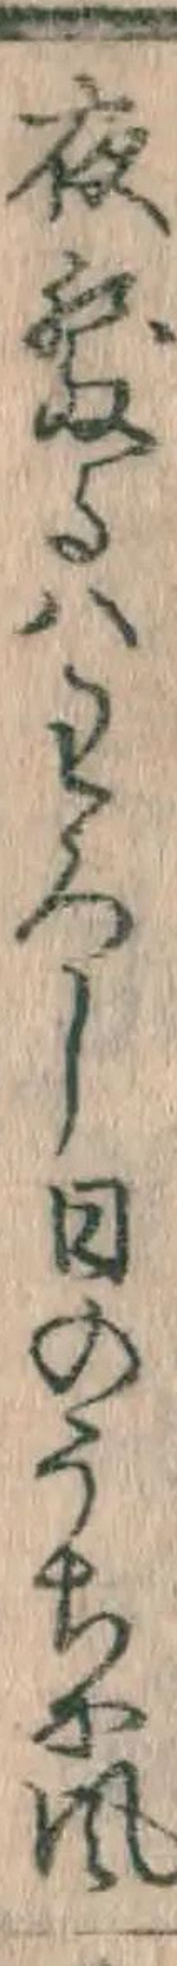夜変るはわろし日のうちに風
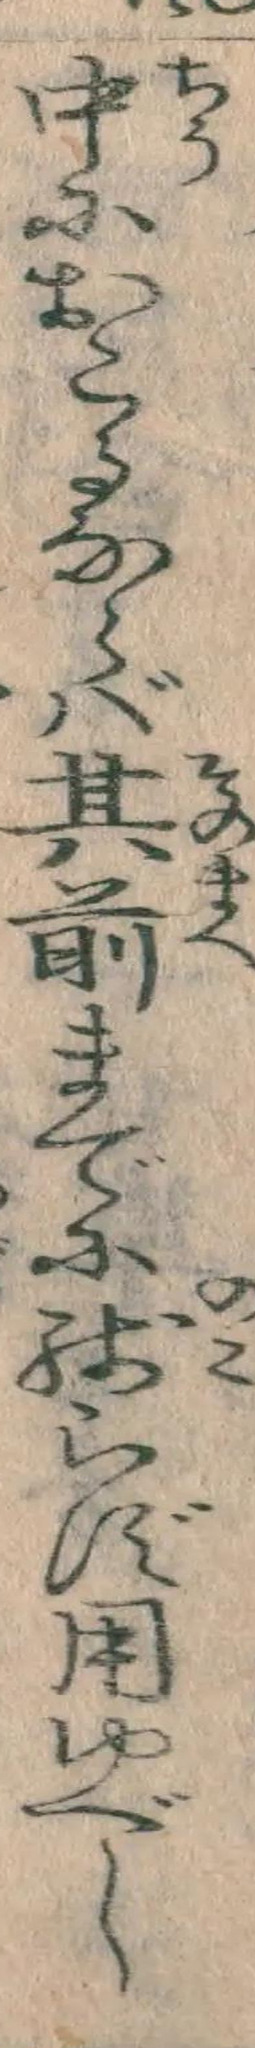中におこるならば其前までに残らず用ゆべし
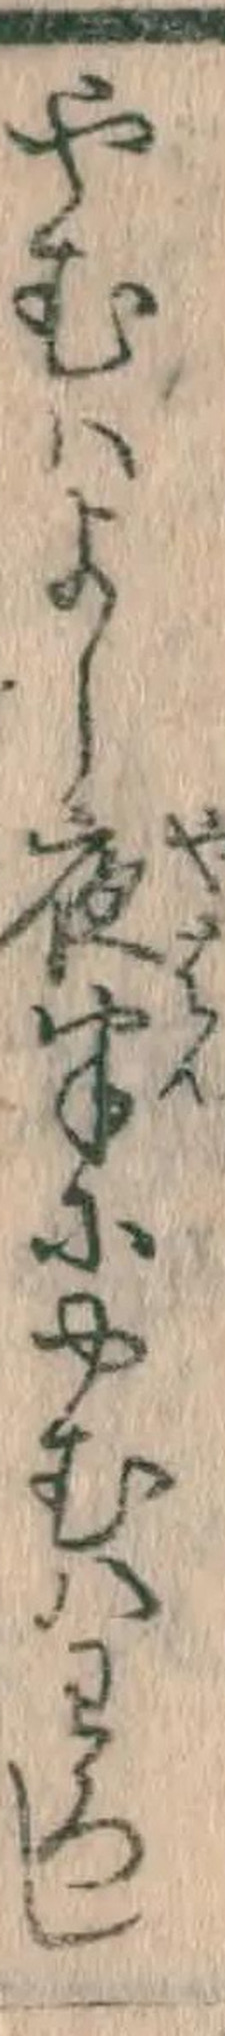やむはよし夜半にやむはわろし
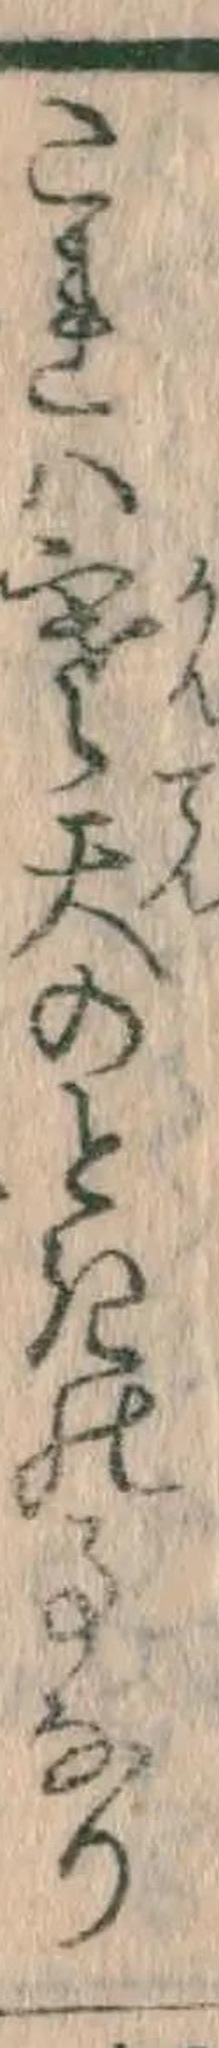これは寒天のときの事なり
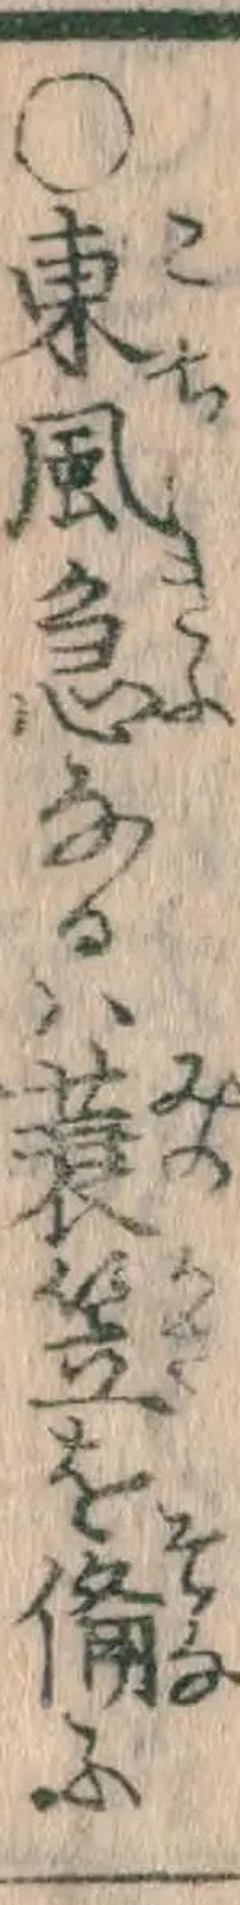○東風急なるは蓑笠を備ふ
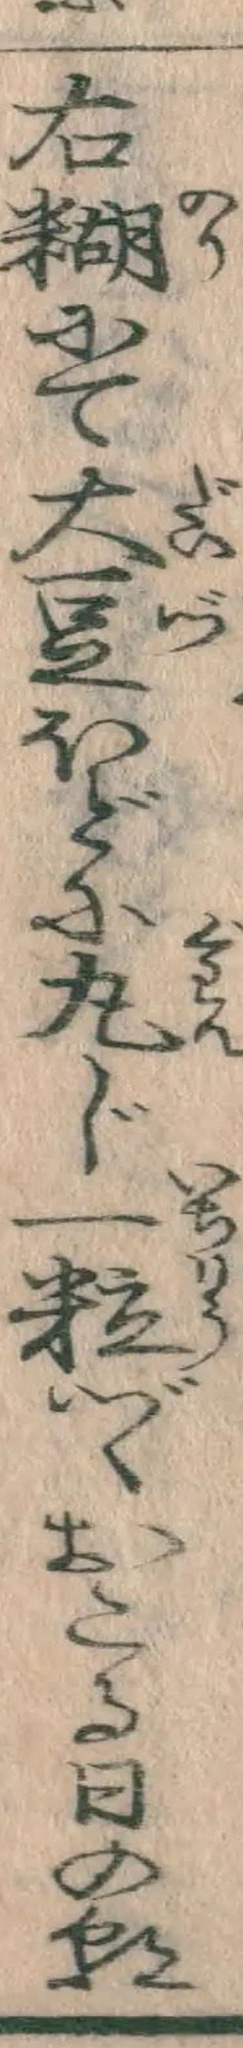右糊にて大豆ほどに丸じ一粒づゝおこる日の朝
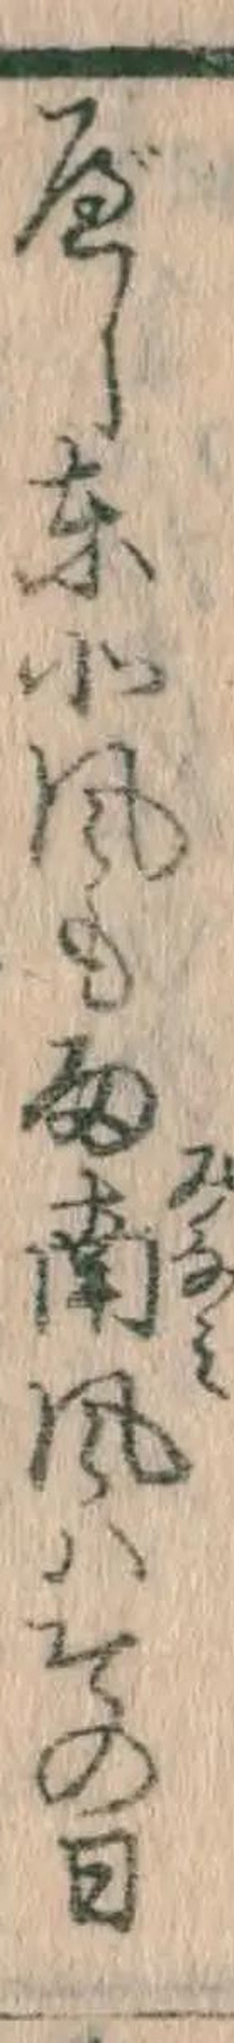べし東北風も雨南風はその日
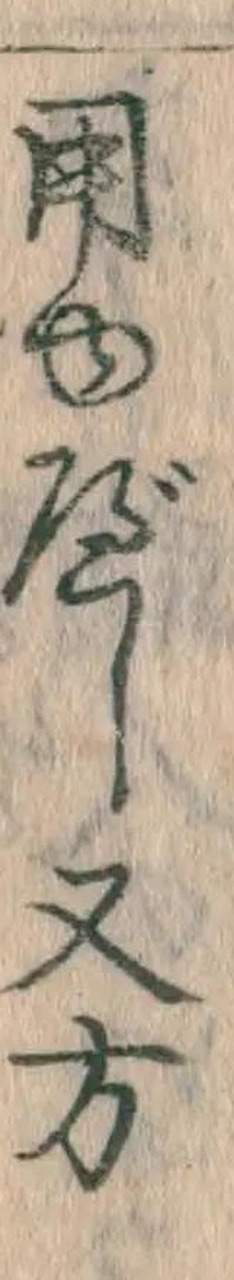用ゆべし又方
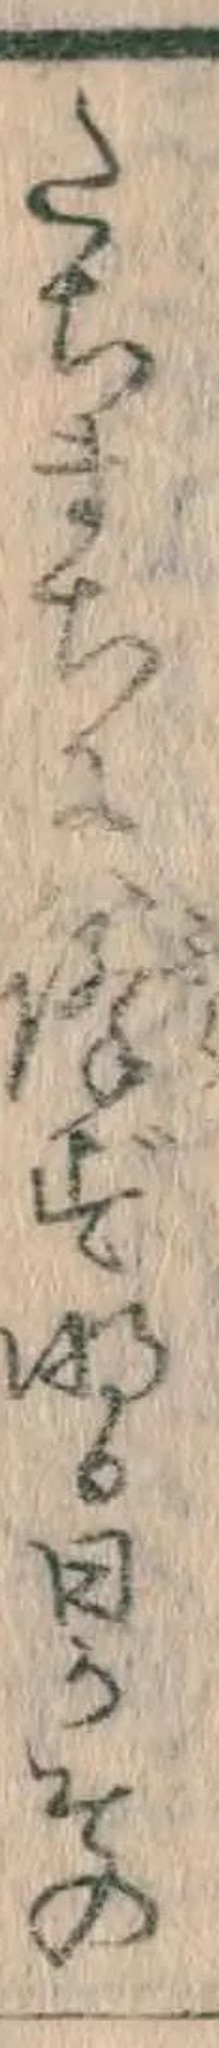たちまちに降ず明る日かその
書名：広益秘事大全 3巻. [3]
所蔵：国立国会図書館 National Diet Library, JAPAN
